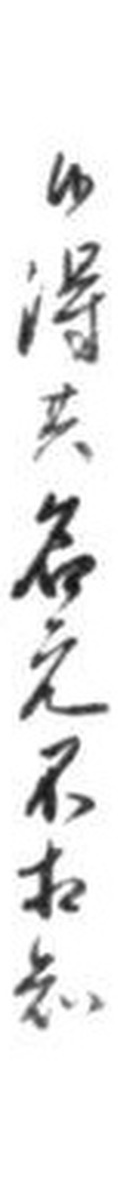候得共名元不相知
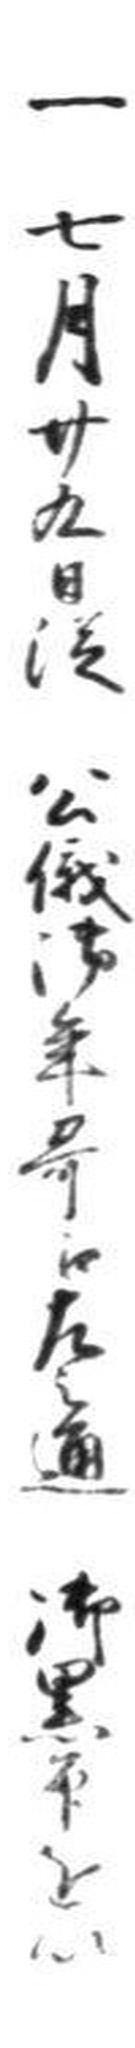一七月廿九日従公儀御年寄江左之通御黒印を以
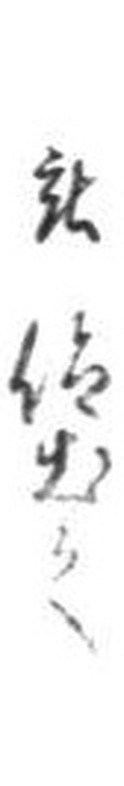被仰出之
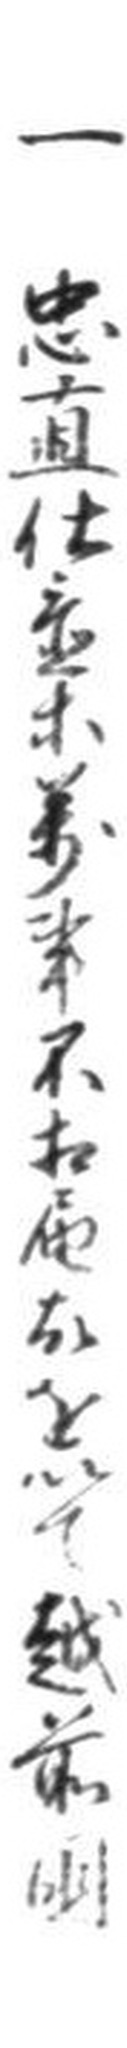一忠直仕置等万事不相届故を以て越前国
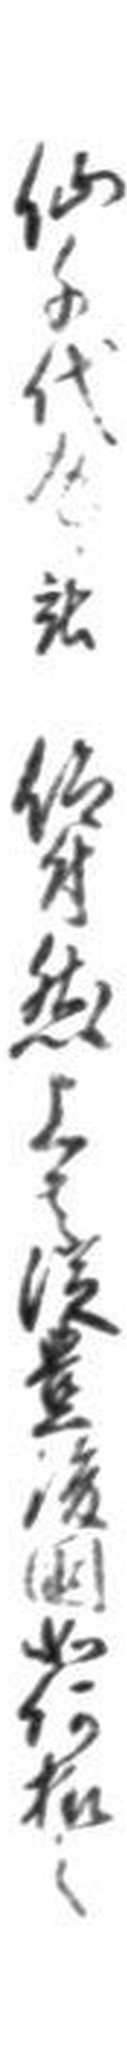仙千代丸被仰付然上者従豊後国如何様之
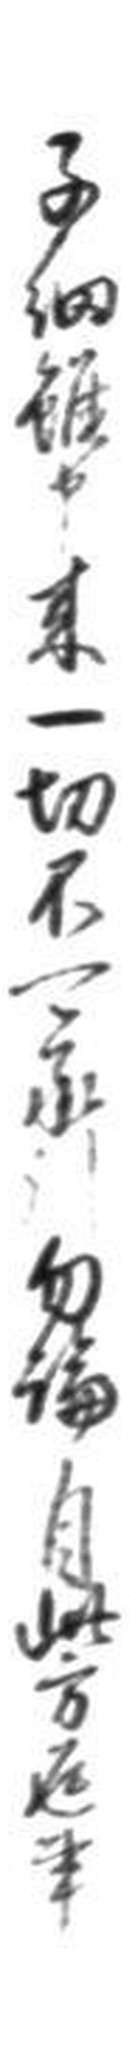子細雖申来一切不可承引勿論自此方返事
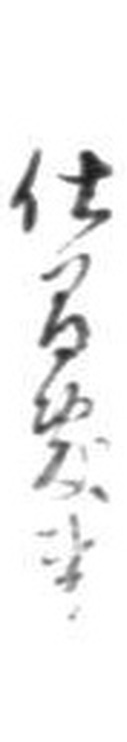仕間敷事
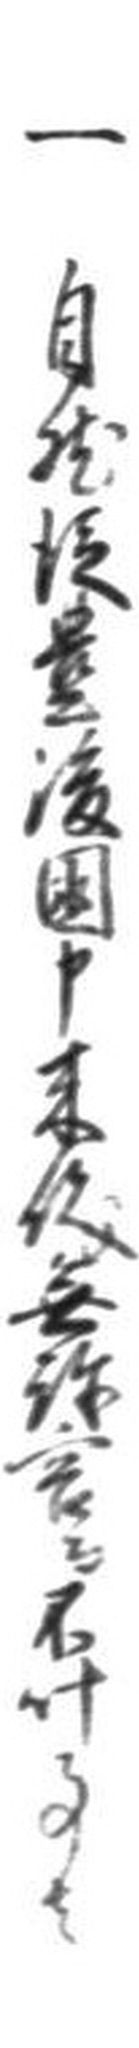一自然従豊後国申来儀無許容而不叶事者
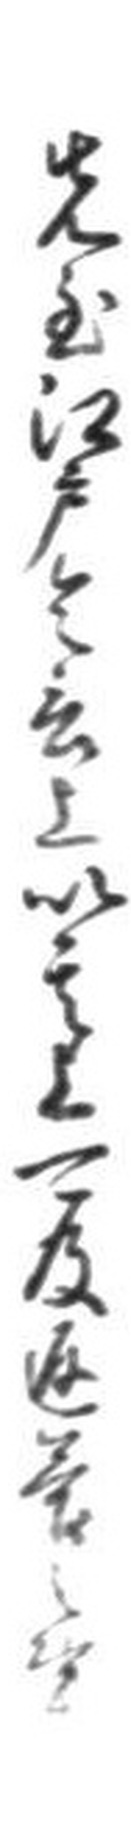先至江戸令言上以其上可及返答之由
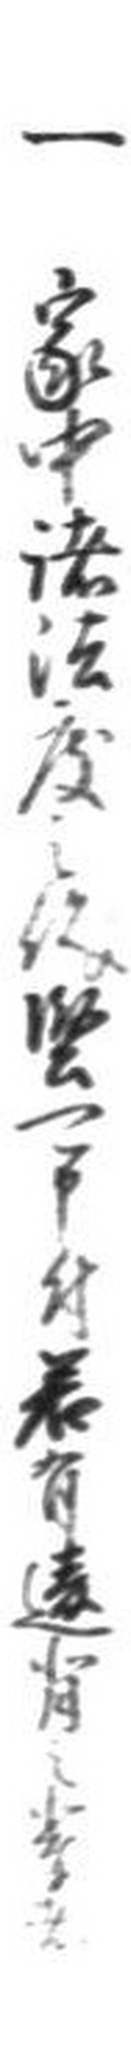一家中諸法度之儀堅可申付若有違背之輩者
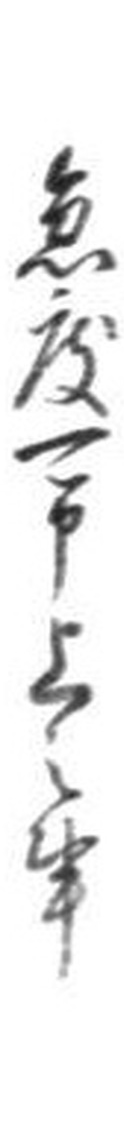急度可申上之事
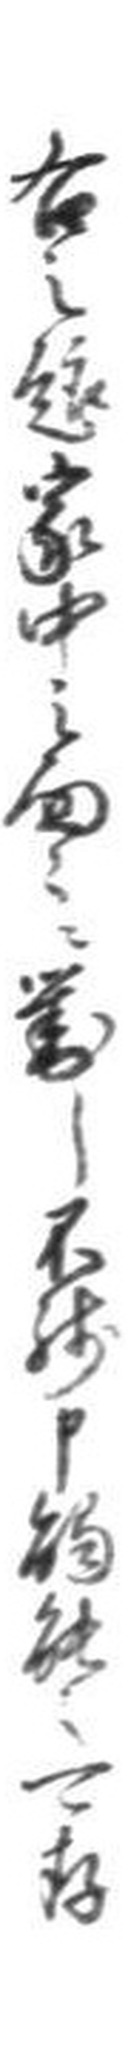右之趣家中之面々ニ対し不残申触能々可存
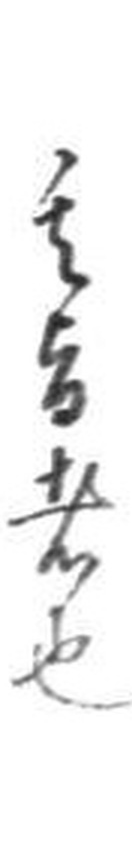其旨者也
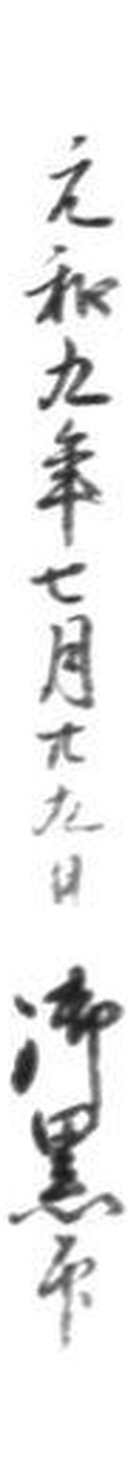元和九年七月廿九日御黒印

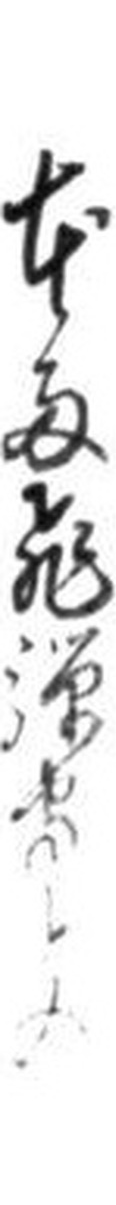本多飛騨守との
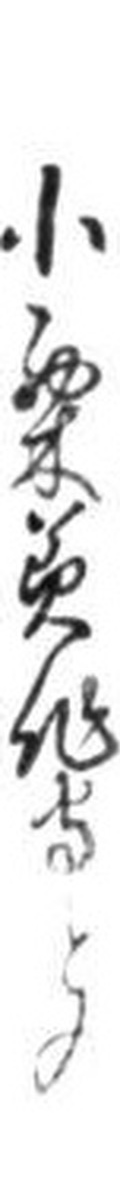小栗美作守との
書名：家譜 二 忠直公 従文禄四年到慶安四年
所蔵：福井県文書館 Fukui Prefectural Archives
